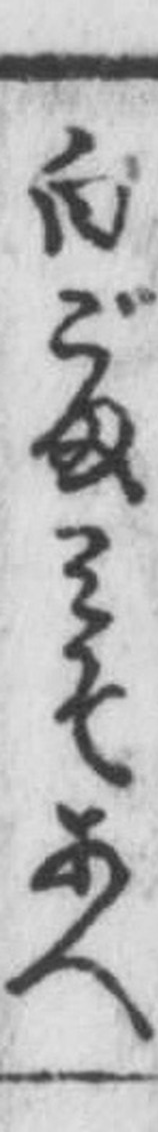白ごまミそあへ
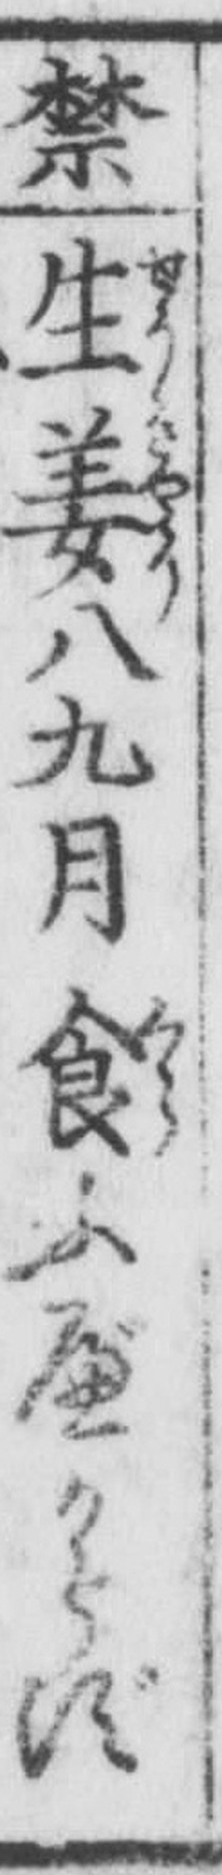禁生姜八九月食ふべからず
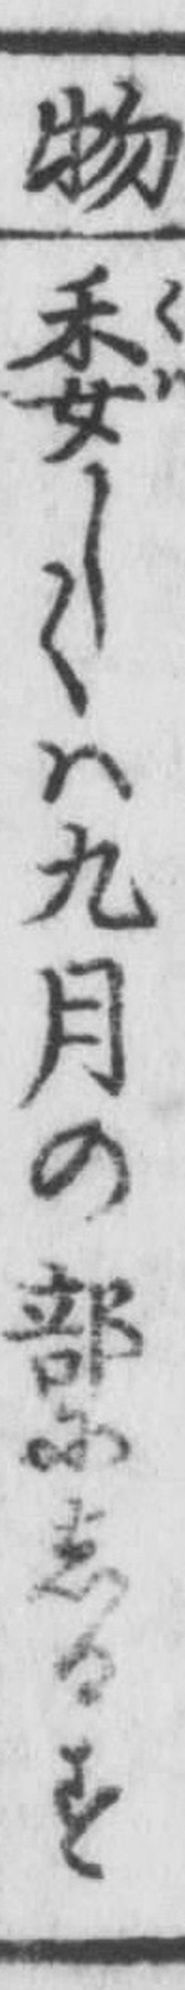物委しくハ九月の部にしるす
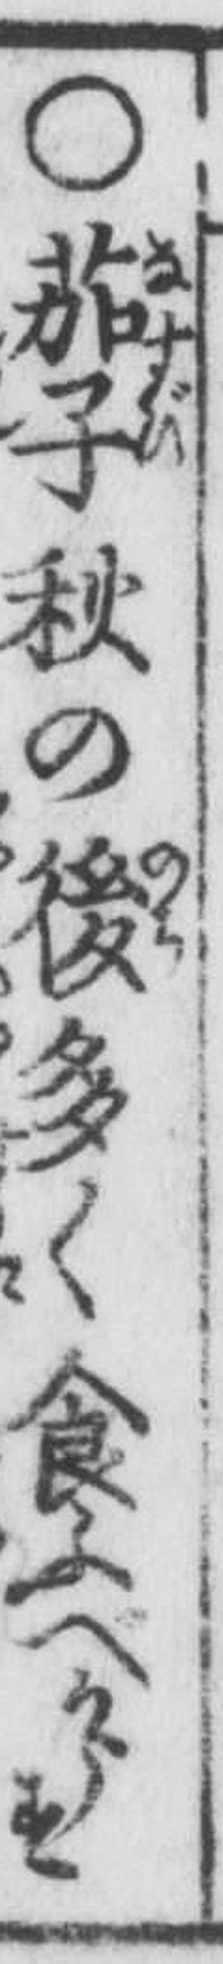〇茄子秋の後多く食ふべからす
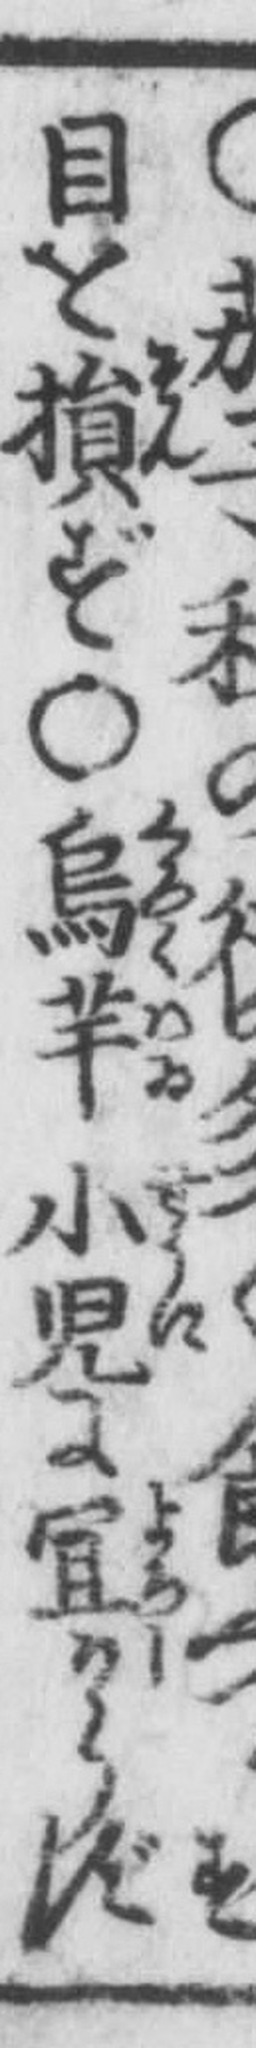目を損ず〇烏芋小児に宜しからず
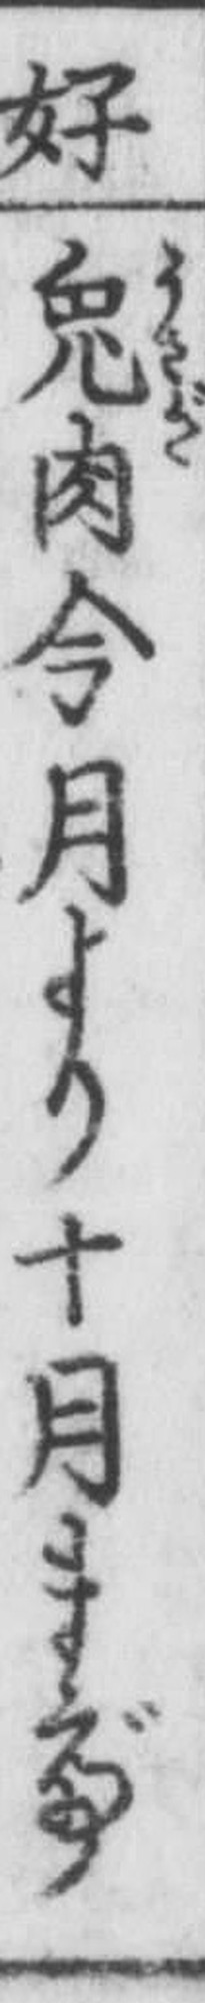好兔肉今月より十月まで
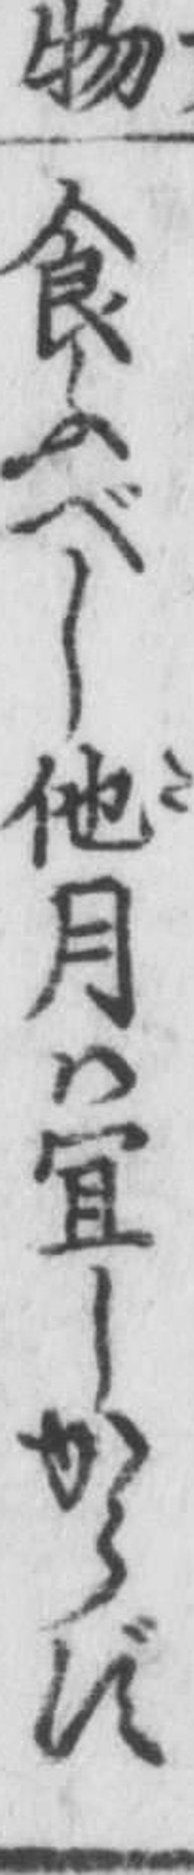物食ふべし他月ハ宜しからず
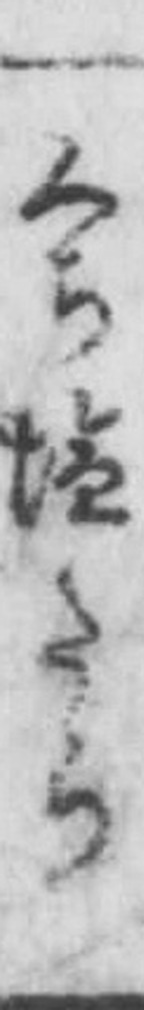鴨口塩たら

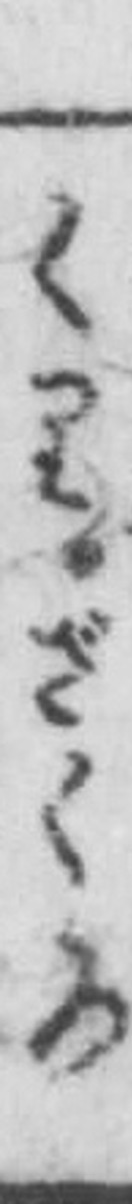くりざくろ
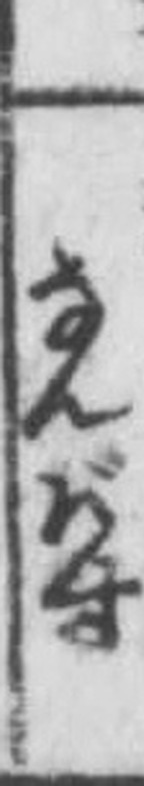なんバす
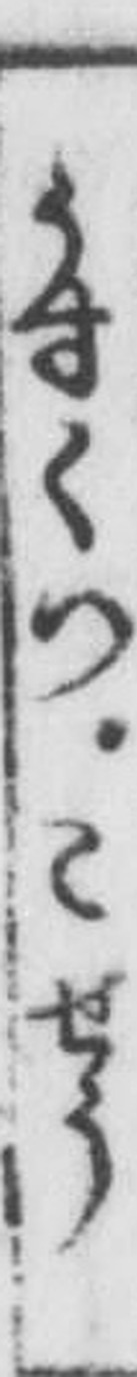うすくづこせう
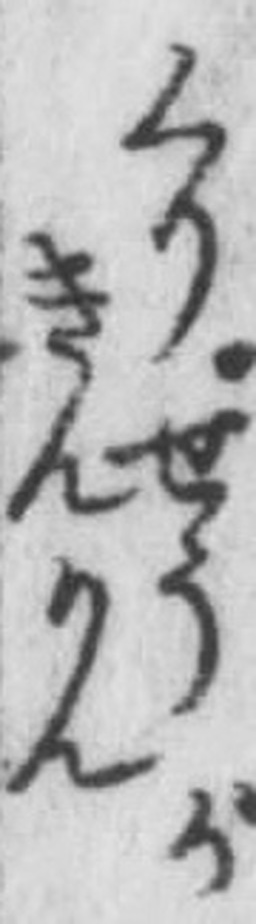きんかん
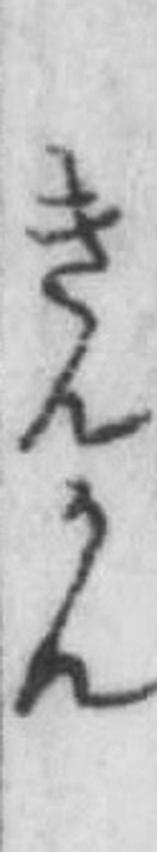きんかん

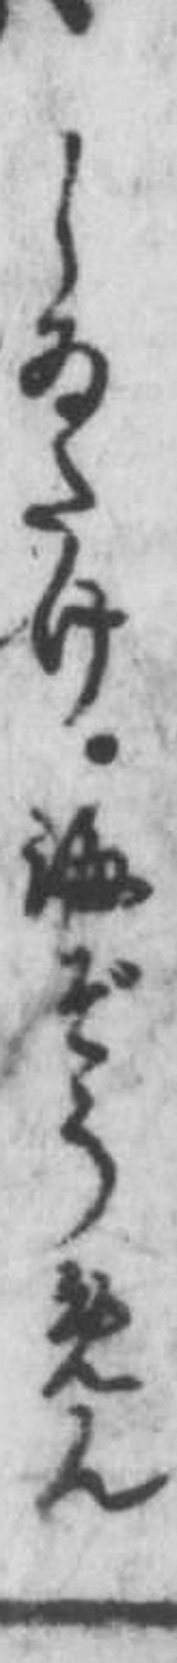しゐたけ海ぞうめん
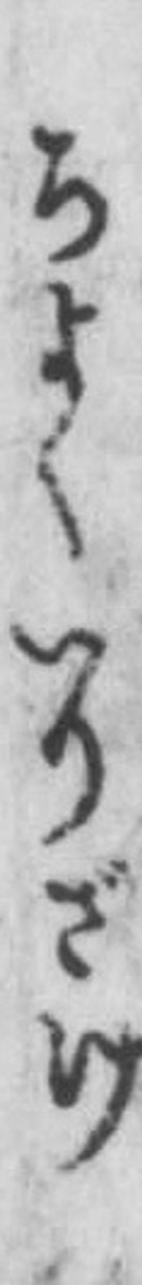ちよくいりざけ
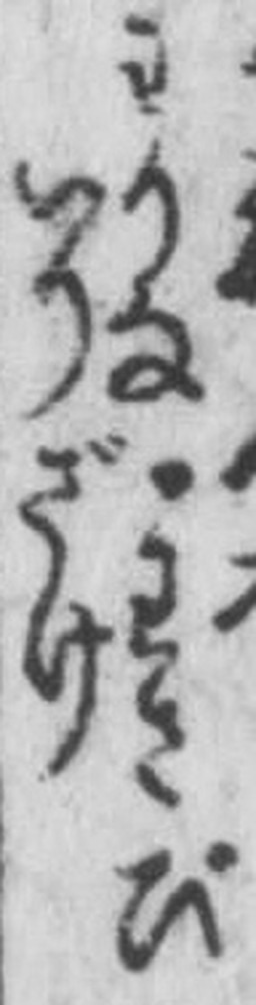いりざけ
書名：当世料理筌
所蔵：大阪府立大学学術情報センター 国文学研究資料館
